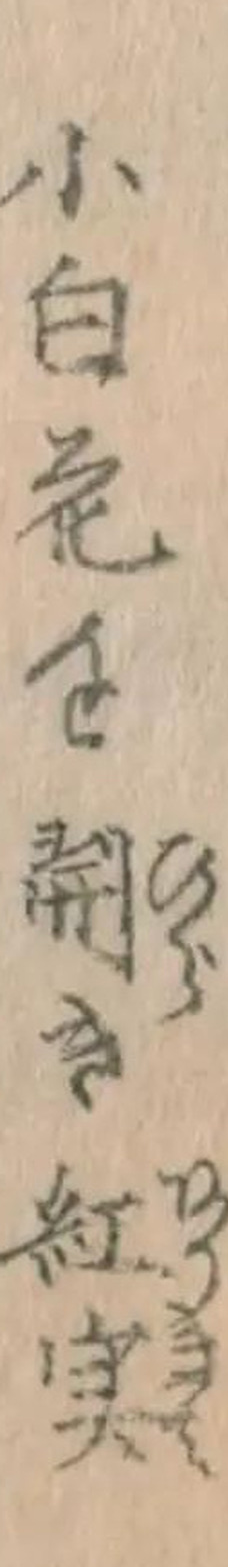小白花を開き紅実
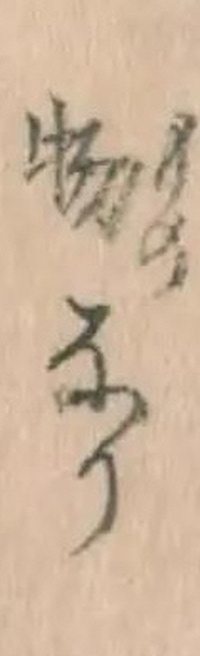物なり

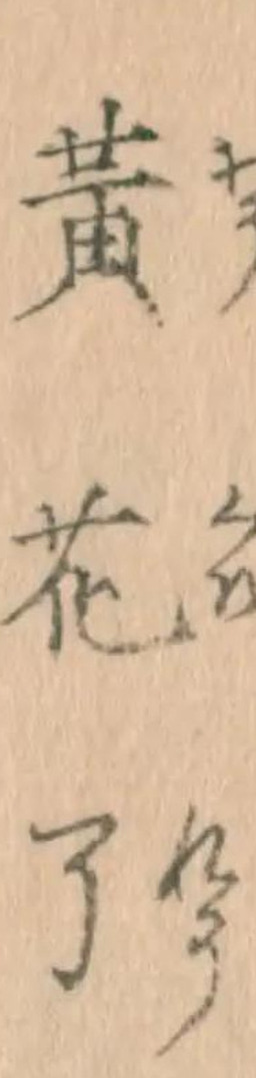黄花了
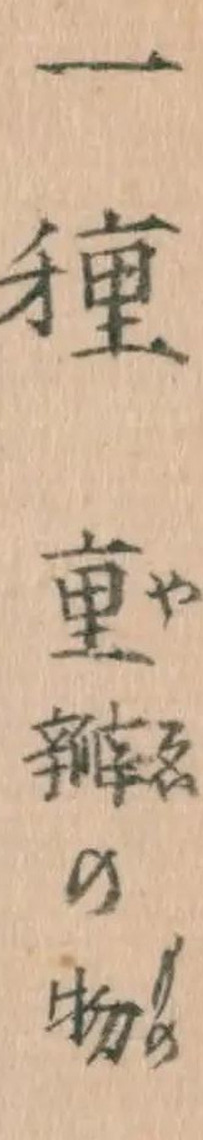一種重弁の物
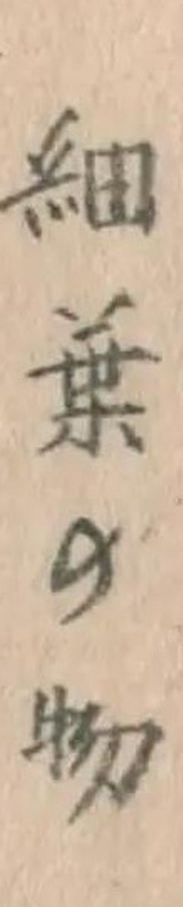細葉の物

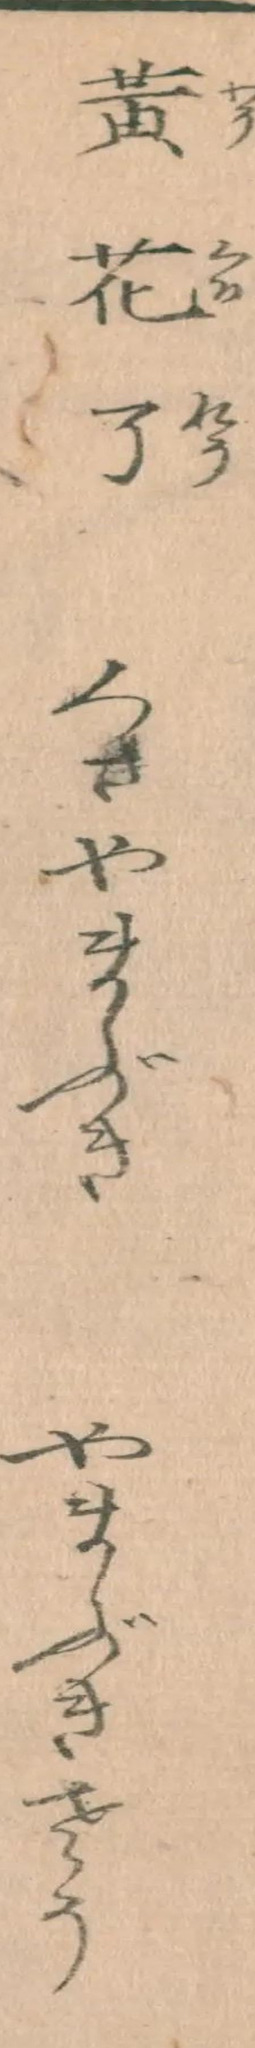黄花了くさやまぶきやまぶきさう
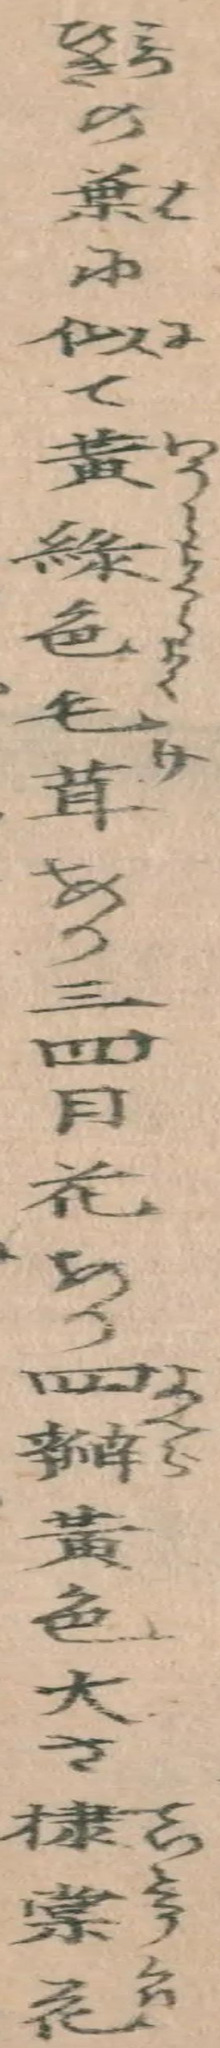みつひきの葉に似て黄緑色毛茸あり三四月花あり四弁黄色大さ棣棠花
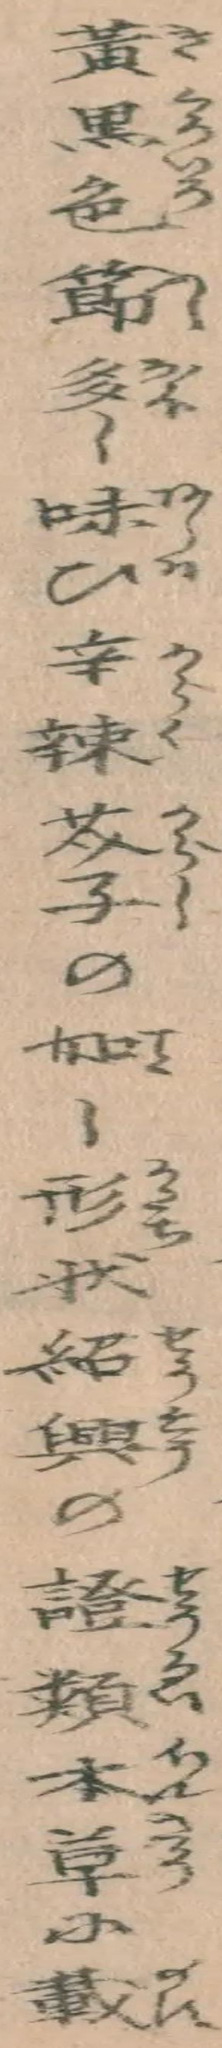黄黒色節多し味ひ辛辣芥子の如し形状紹興の証類本草に載
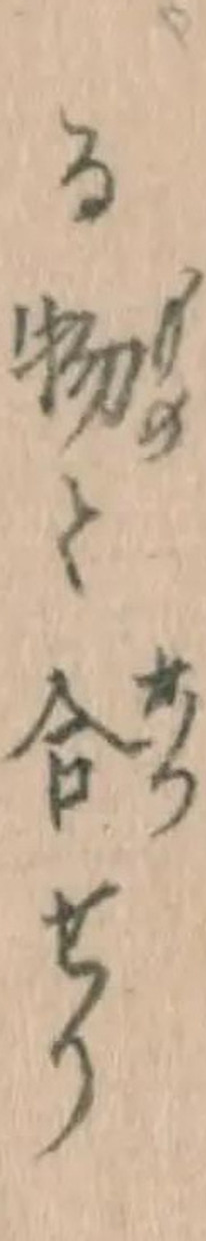る物と合せり
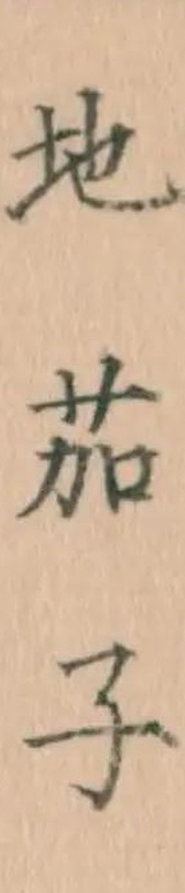地茄子
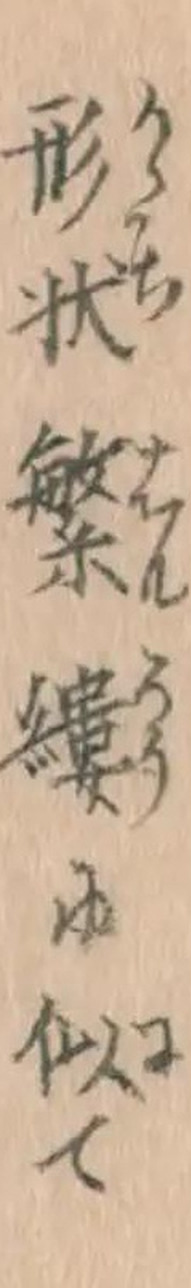形状繁縷に似て
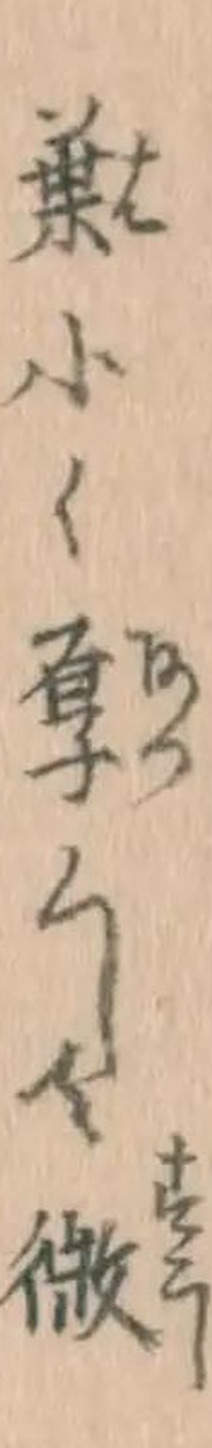葉小く厚くして微
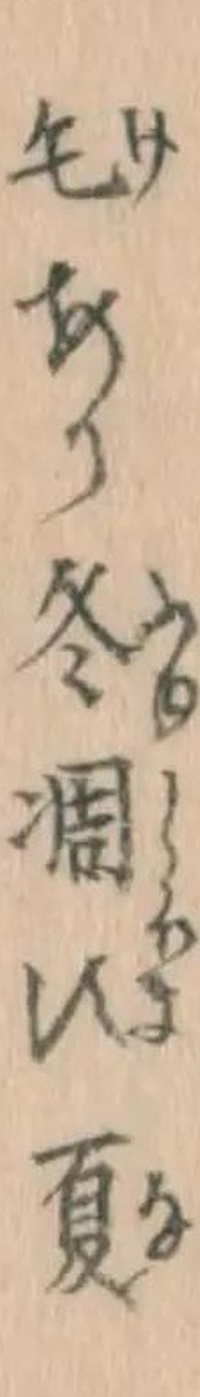毛あり冬凋す夏
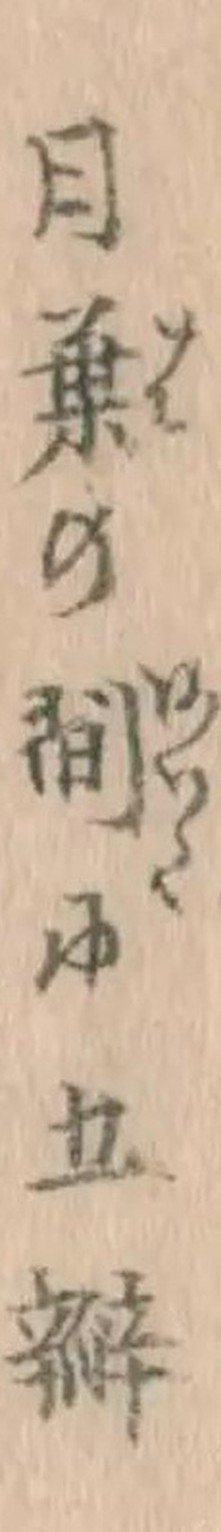月葉の間に五弁
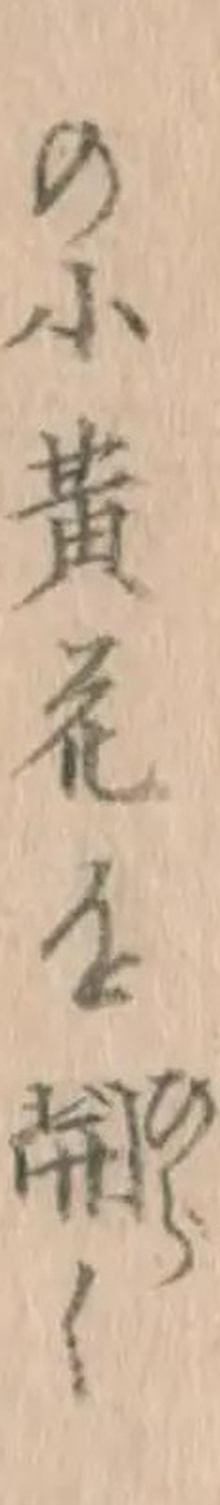の小黄花を開く
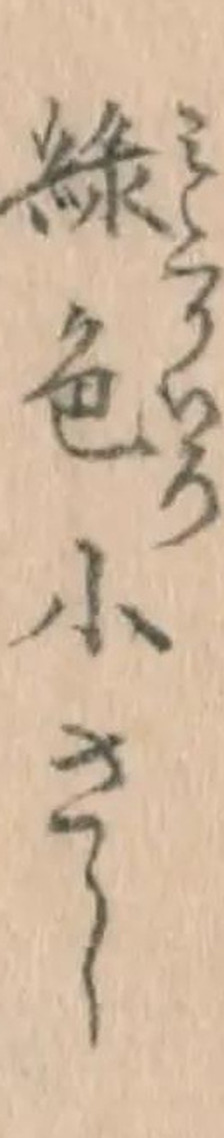緑色小さし
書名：本草図譜. 巻37-39
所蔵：国立国会図書館 National Diet Library, JAPAN
